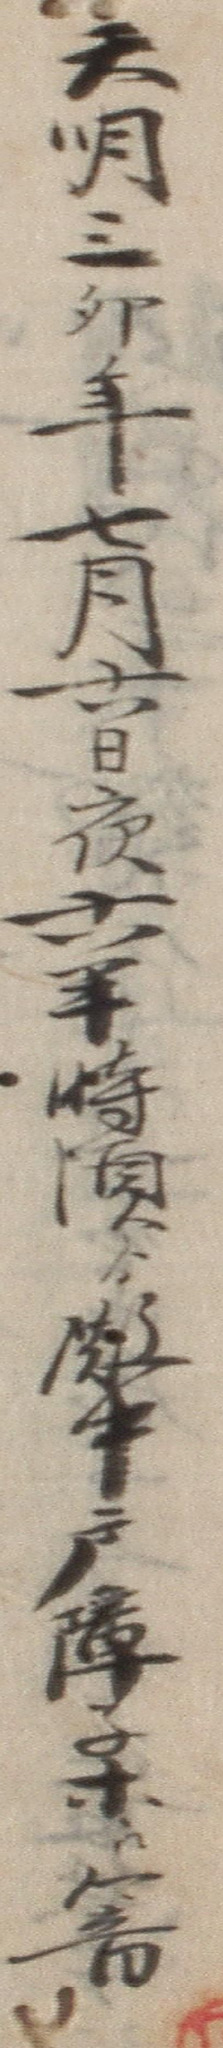天明三卯年七月六日夜六半時頃ゟ殿中戸障子等へ響
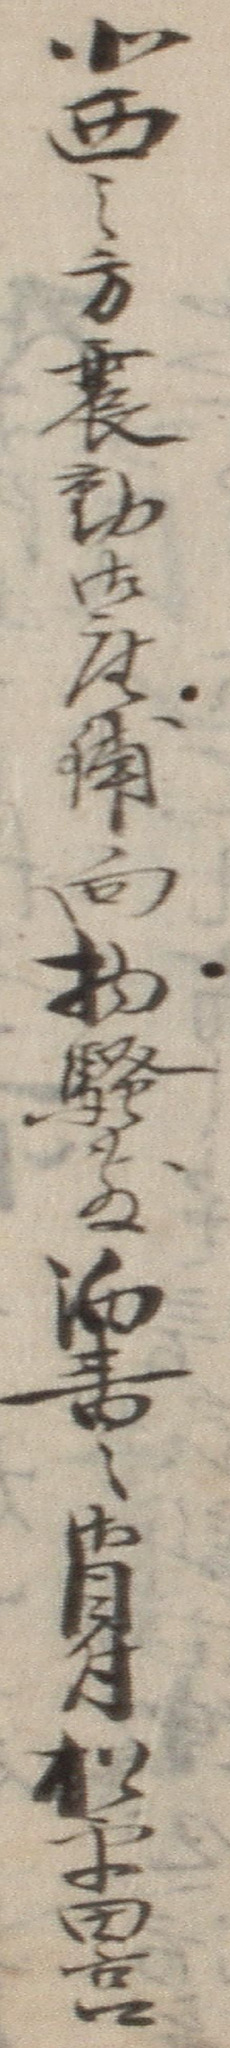北西之方振動御座鋪向物騒敷泊番之御目付松平田宮
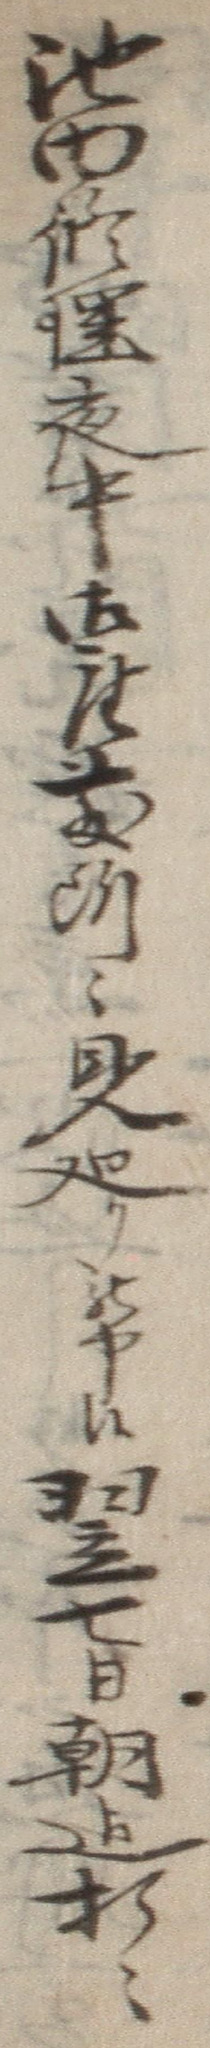池田修理夜中御座敷所々見廻リ被申候翌七日朝迄折々
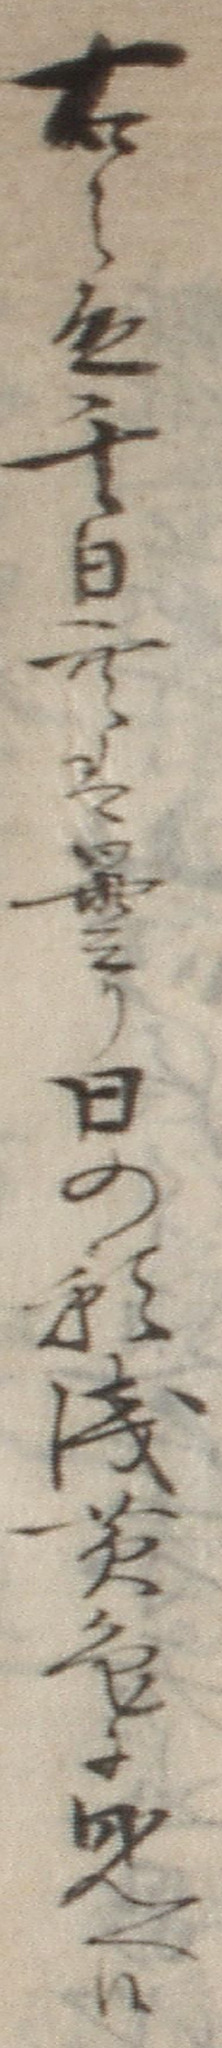右之通其日空は曇り日の影浅黄色に見へ候
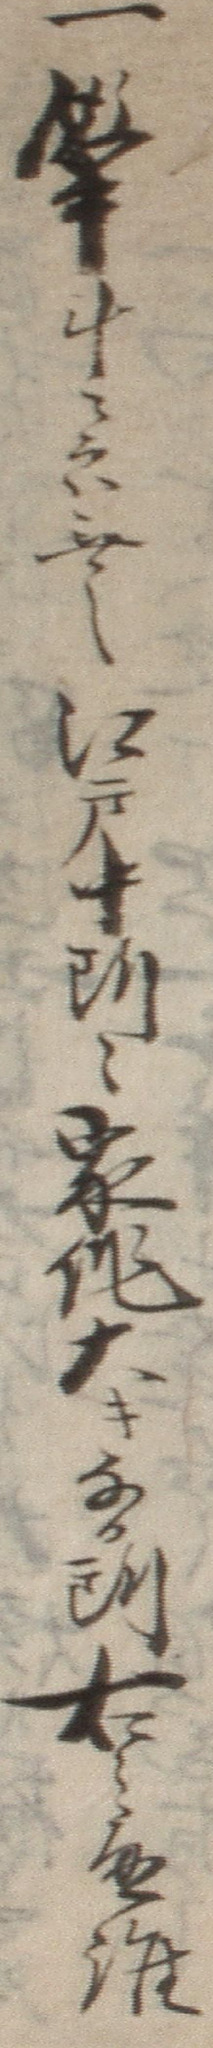一殿中斗ニ而は無之江戸中所々家作大キなる所右之通誰
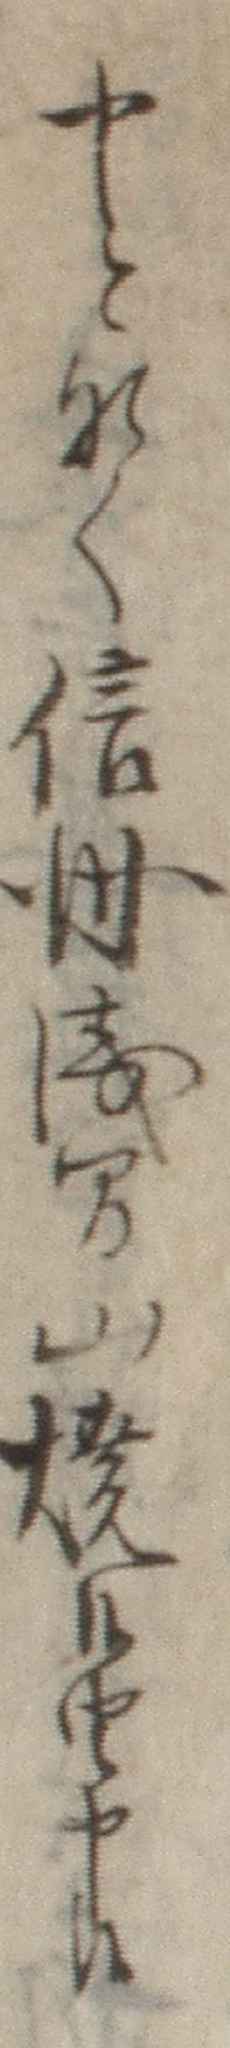申となく信州浅間山焼候由申候
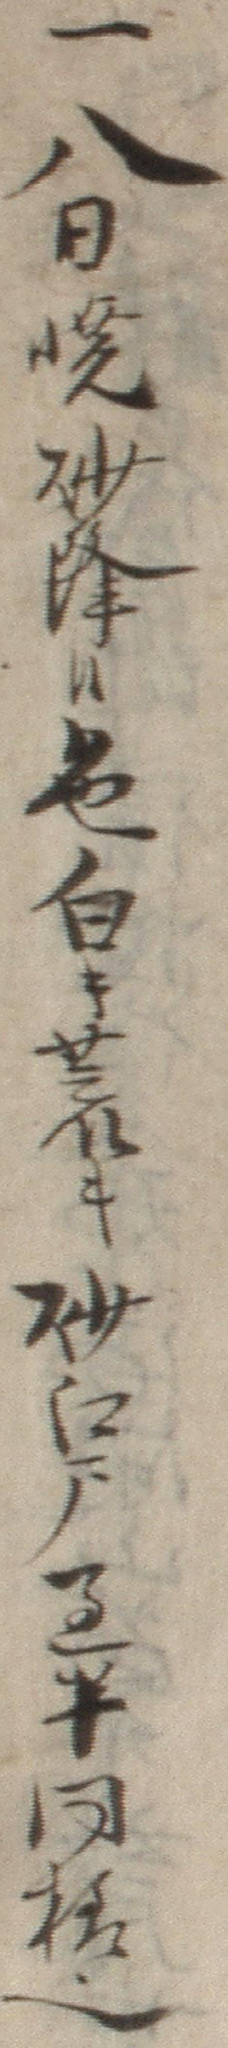一八日暁砂降候色白キ荒キ砂江戸過半同様也
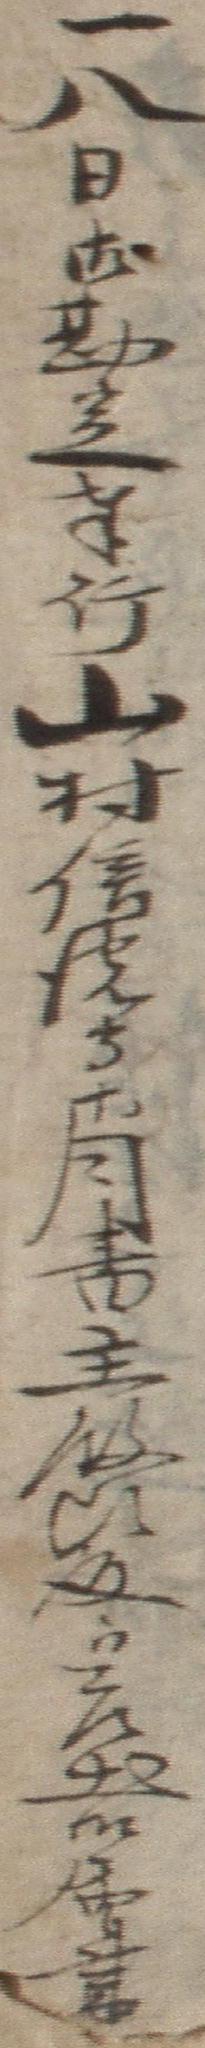一八日御勘定奉行山村信濃守御月番主殿頭殿江差出候届書

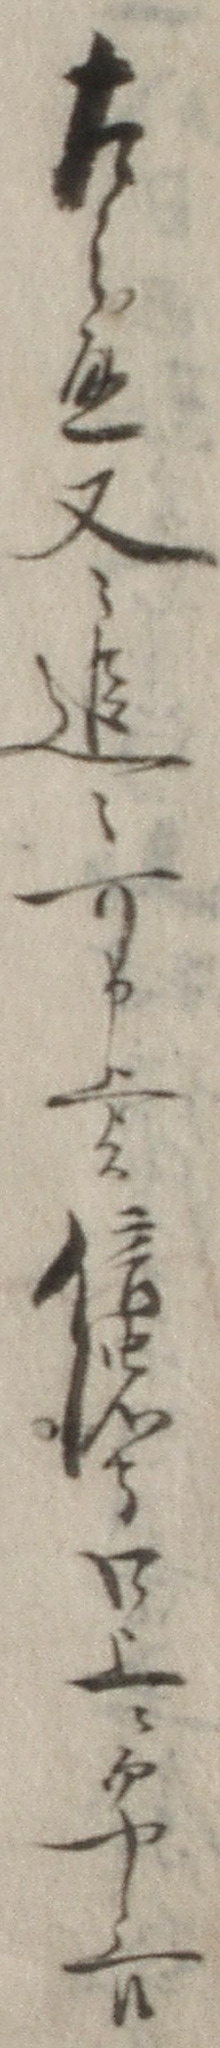右之通又々追々可申旨信濃守口上ニ而申上候
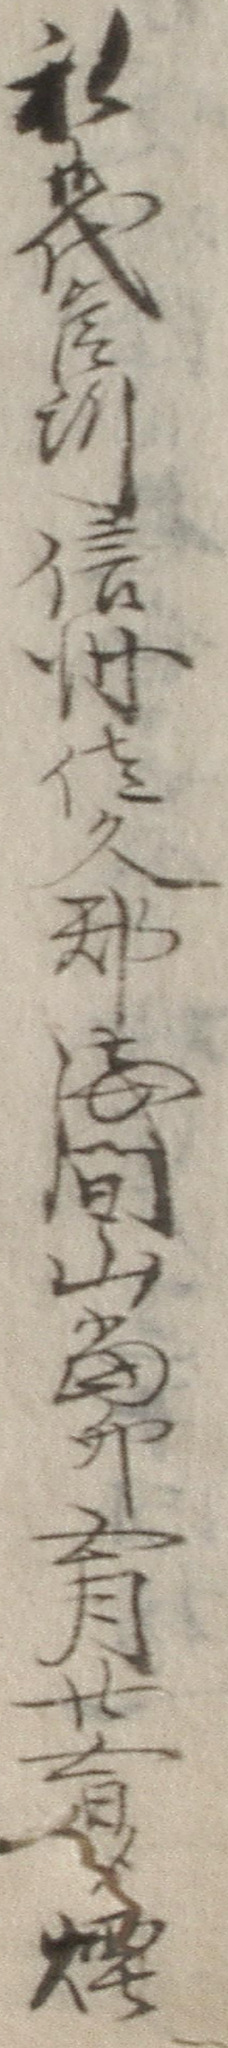私御代官所信州佐久郡浅間山当卯五月廿五日ゟ煙
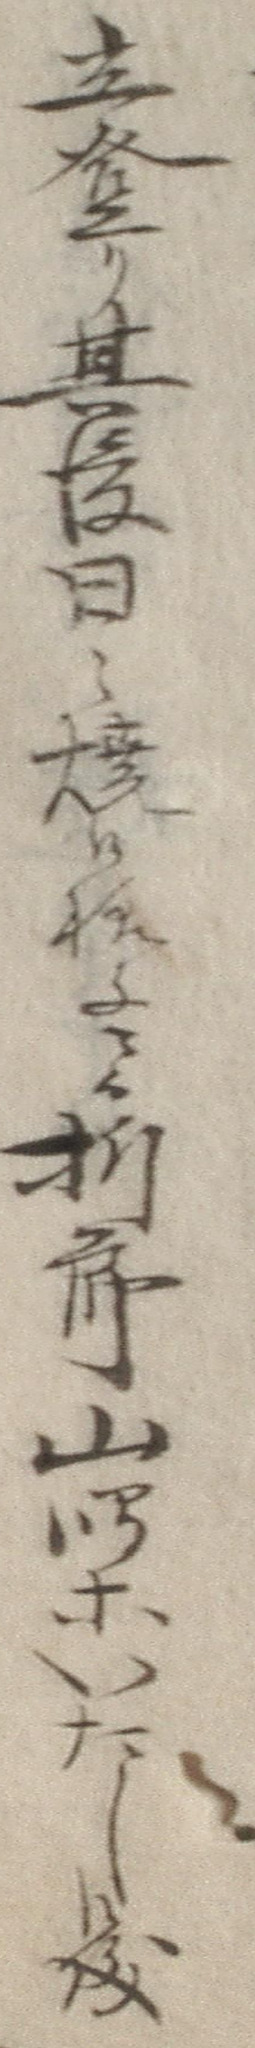立登リ其後日々焼候様子ニ而折節山鳴等いたし候儀
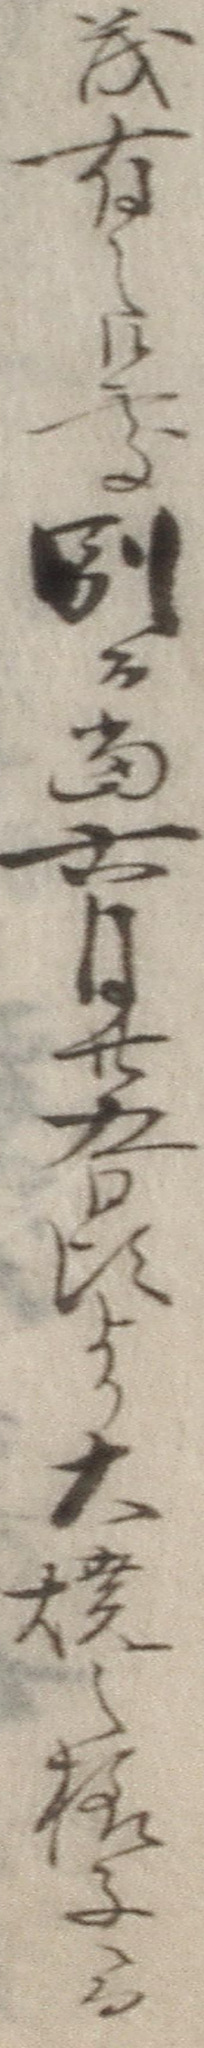茂有之候処別而当六月廿九日比より大焼之様子ニ而
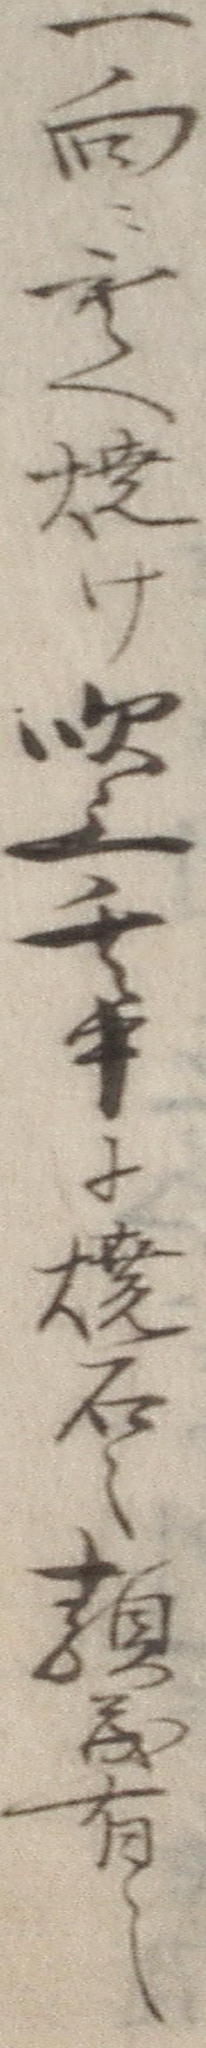一向ニ空へ焼け吹上其中に焼石之類茂有之
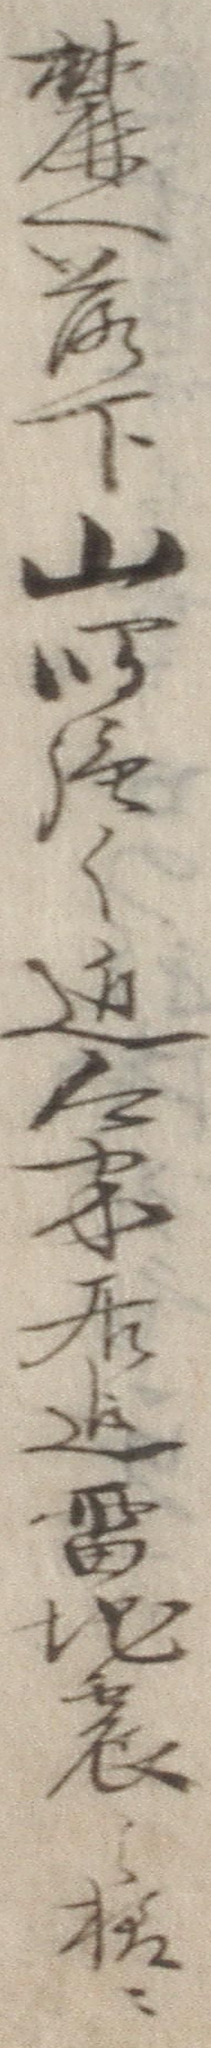麓へ落下山鳴強く近郷家居迄雷地震之様ニ
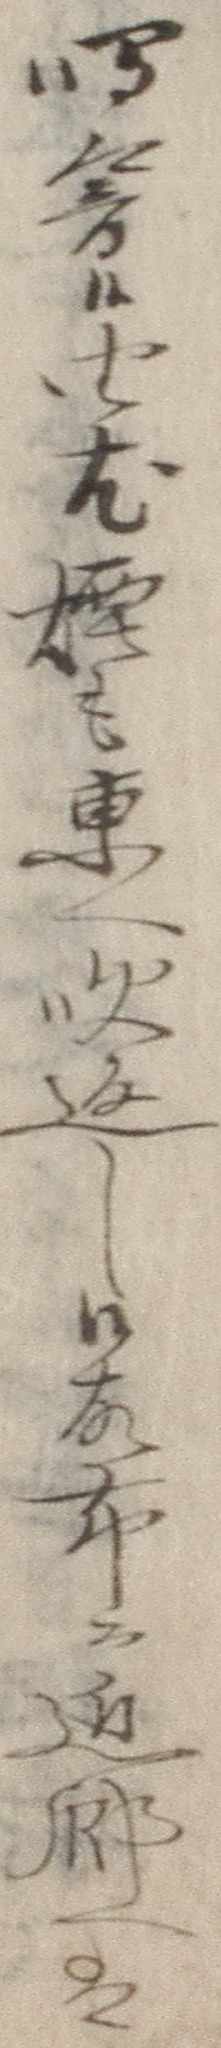鳴響候由尤煙も東へ吹返し候故却而近郷へは
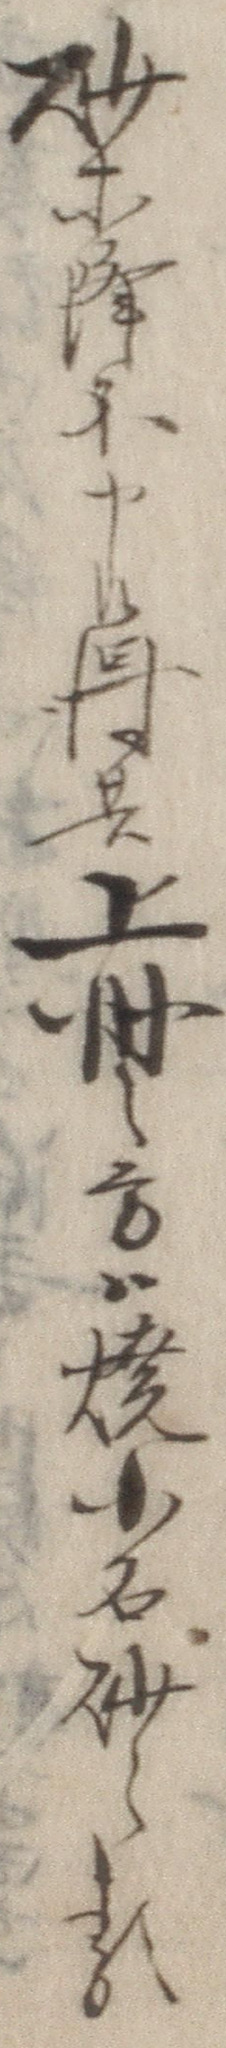砂等降不申候得共上州之方は焼小石砂之類
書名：[諸国災害記録]
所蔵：東京大学地震研究所図書室 Earthquake Research Institute Library, The University of Tokyo, JAPAN
